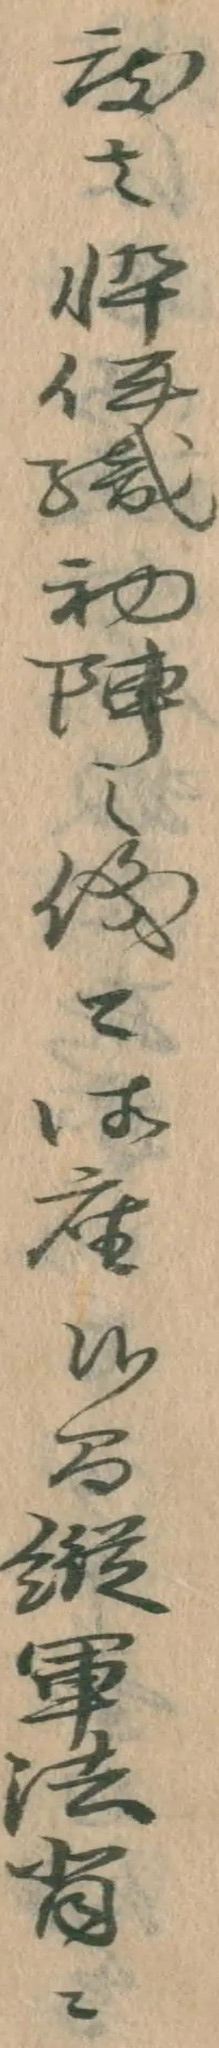度者忰伊織初陣之儀に御座候間縦軍法背に
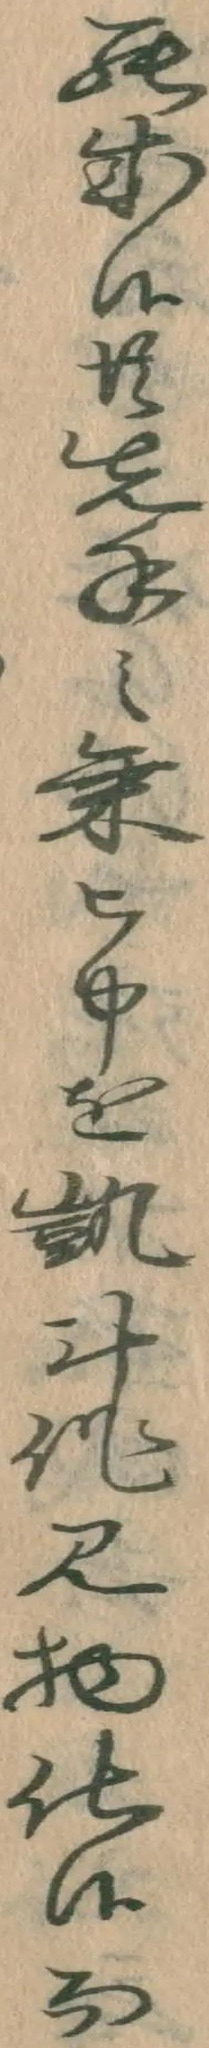罷成候共先手之乗被申を凱斗作見物仕候而
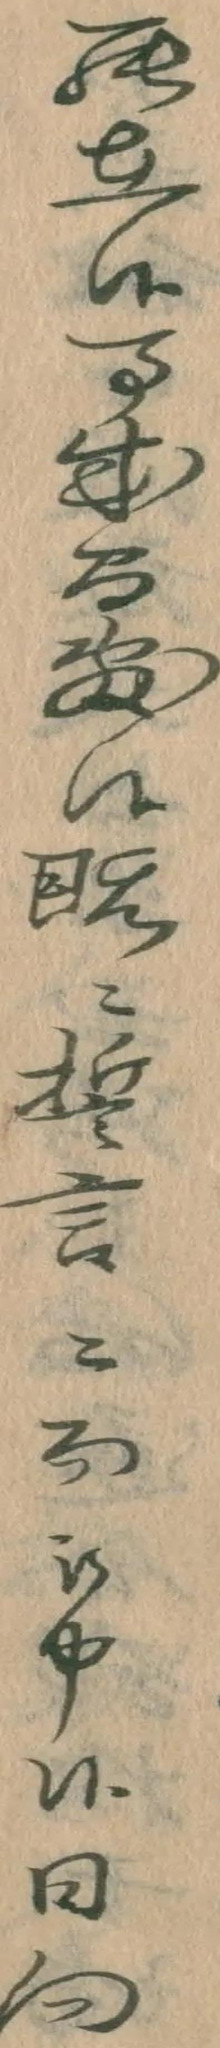罷在候事成間敷候既に誓言に而被申候日向
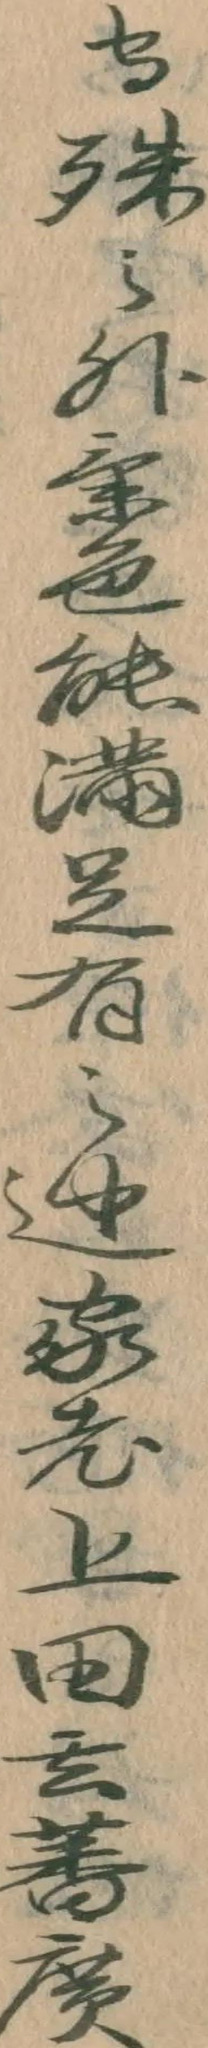守殊之外気色能満足有之迚家老上田玄蕃広
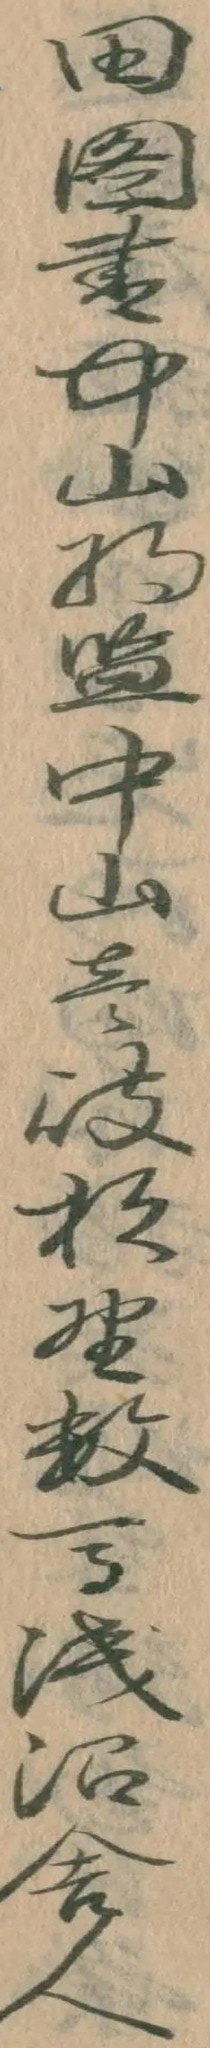田図書中山将監中山壱岐杉野数馬浅沼舎人
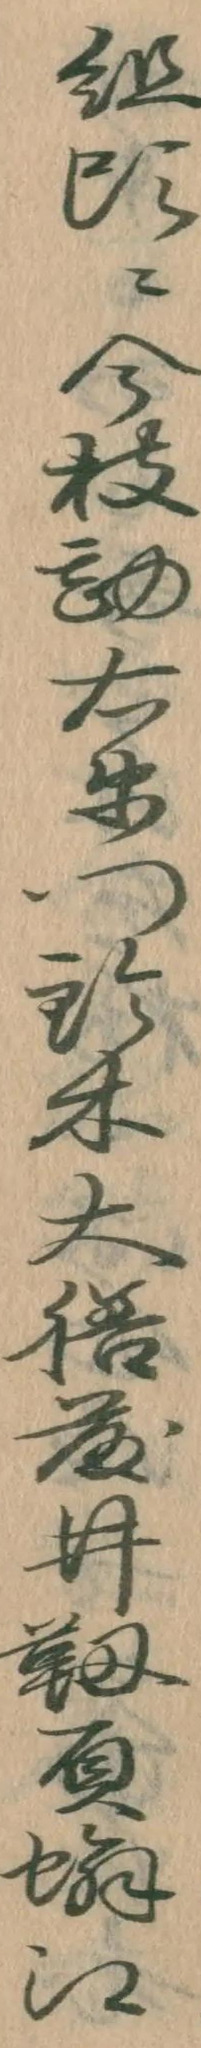組頭に今枝勘右衛門鈴木大膳藤井靭負螉江
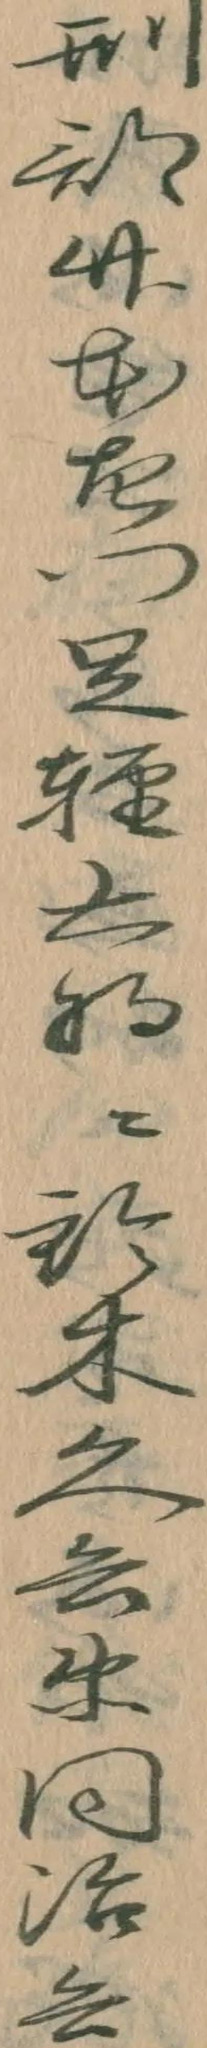刑部竹本左門足軽大将に鈴木久兵衛同治兵
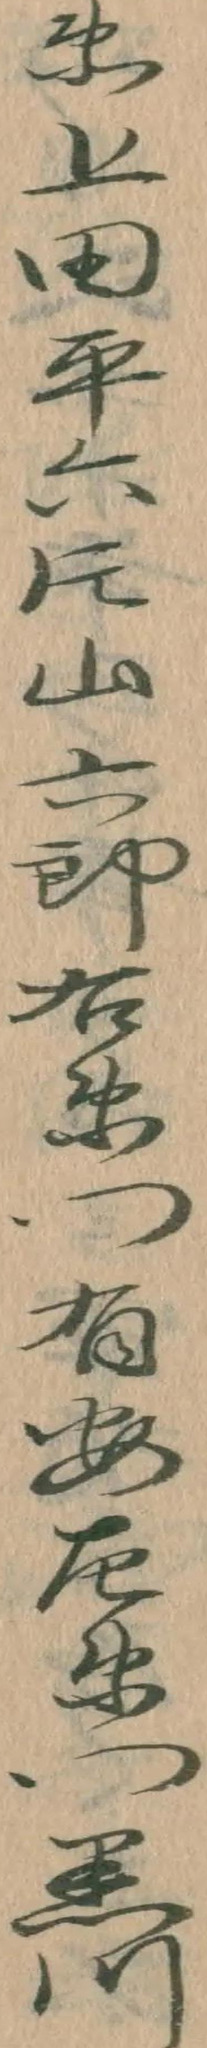衛上田平六片山六郎右衛門有安左衛門黒川
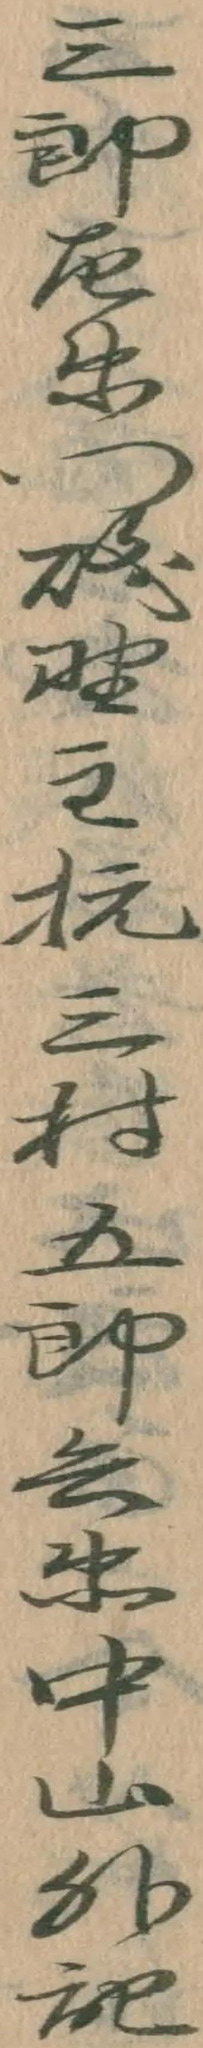三郎左衛門磯野主杭三村五郎兵衛中山外記
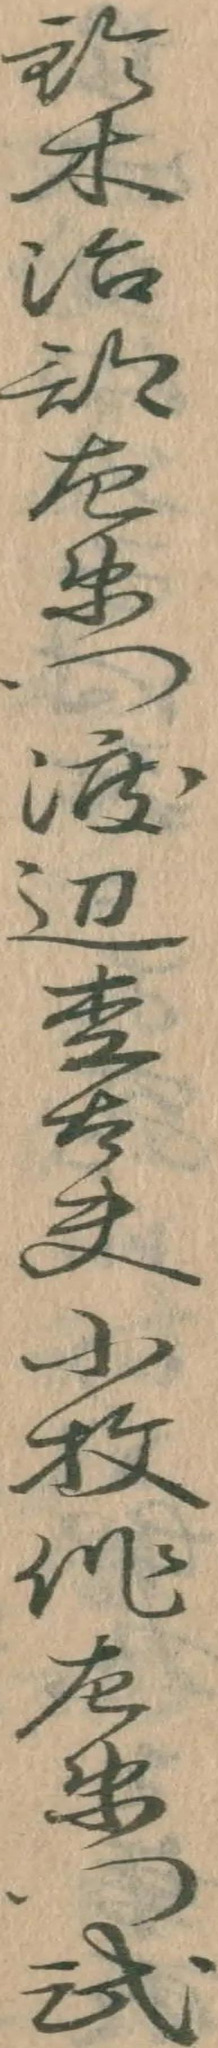鈴木治部左衛門渡辺杢太夫小牧作左衛門武
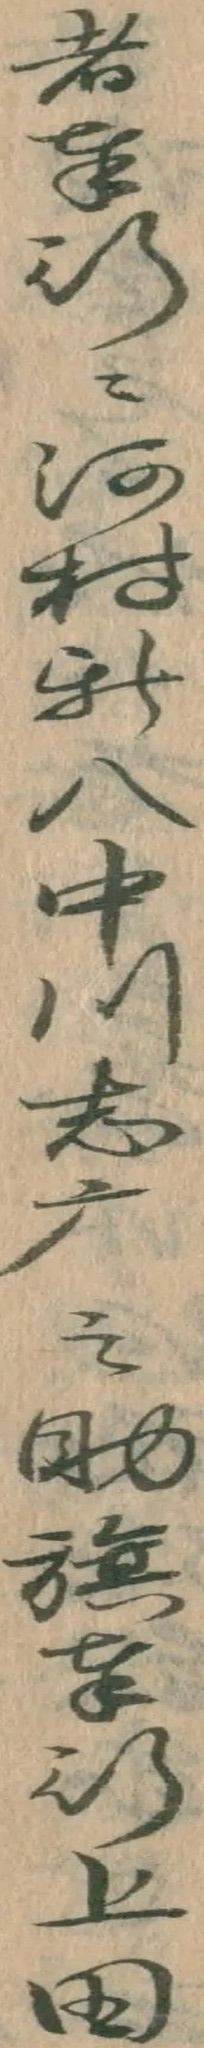者奉行に河村新八中川志摩之助旗奉行上田
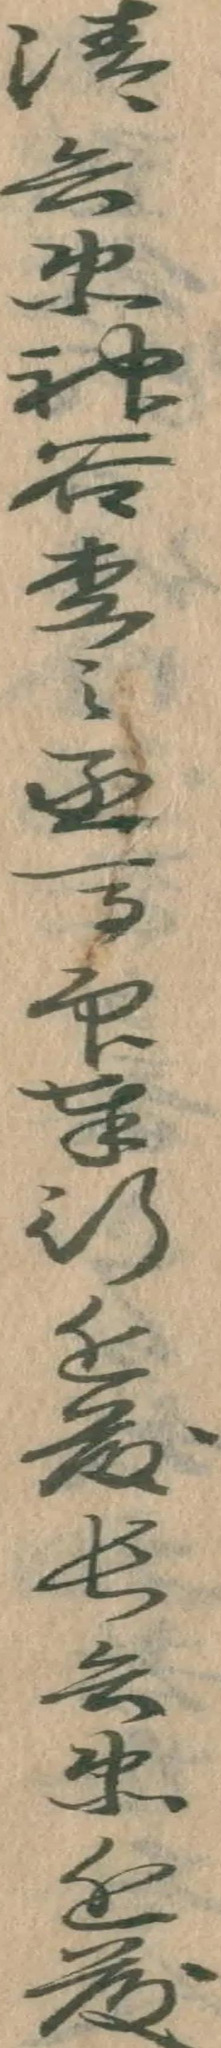清兵衛神谷杢之丞馬印奉行近藤長兵衛近藤
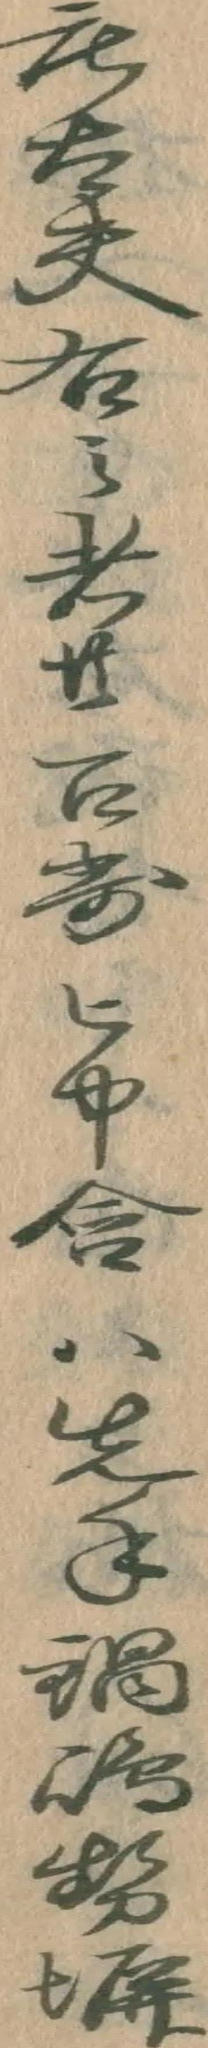庄太夫右之者共召寄被申合は先手鍋島勢塀
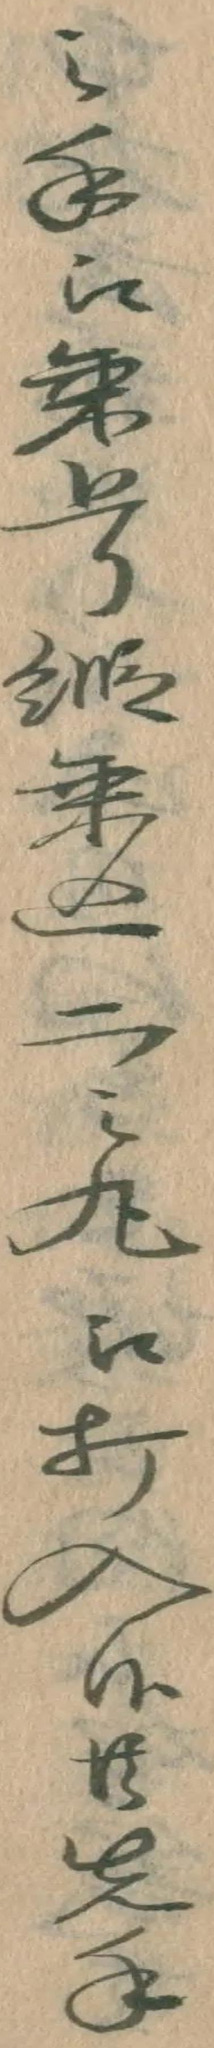之手江乗廻り縦乗込二之丸江打入候共先手
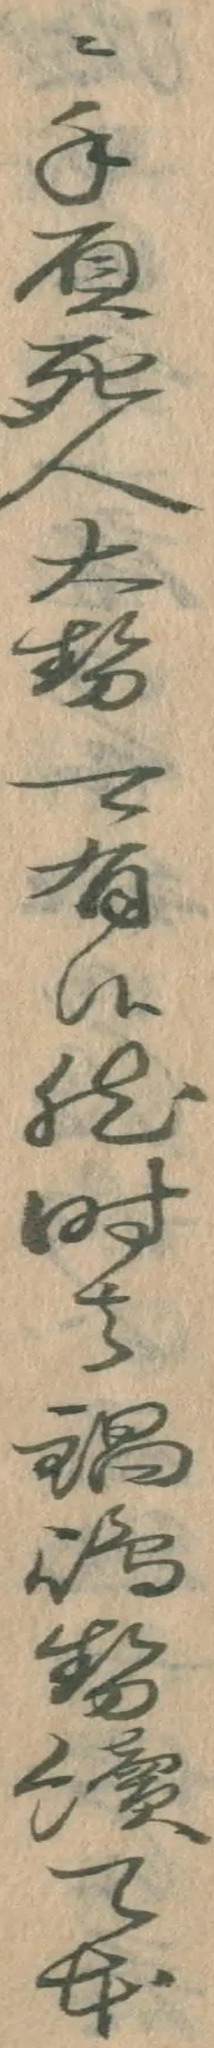に手負死人大勢可有候然時者鍋島勢続て本
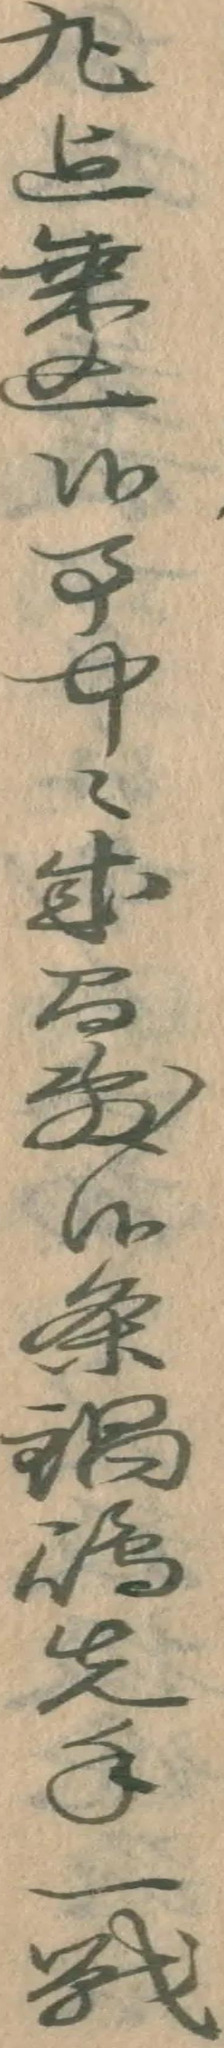丸迄乗込候事中々成間敷候条鍋島先手一戦
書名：切支丹御退治記 49巻. [7]
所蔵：国立国会図書館 National Diet Library, JAPAN
